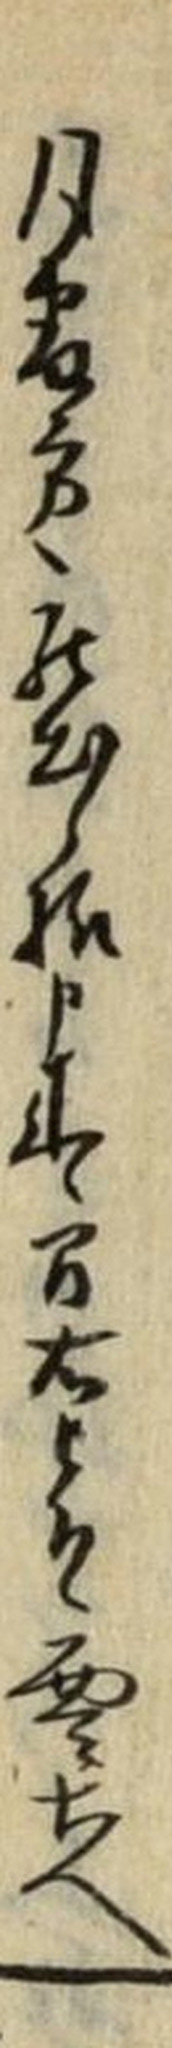月番方へ罷出候様申来候間右被下候面々十人
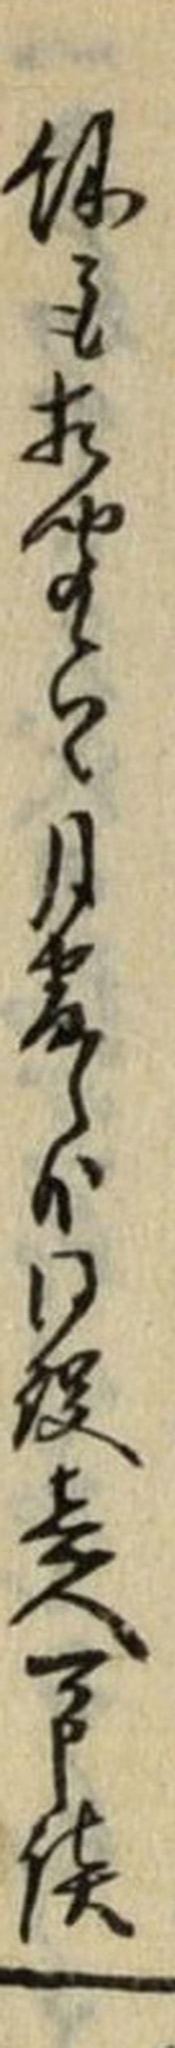餘にも相聞候はゝ月番之外同役壱人可申談
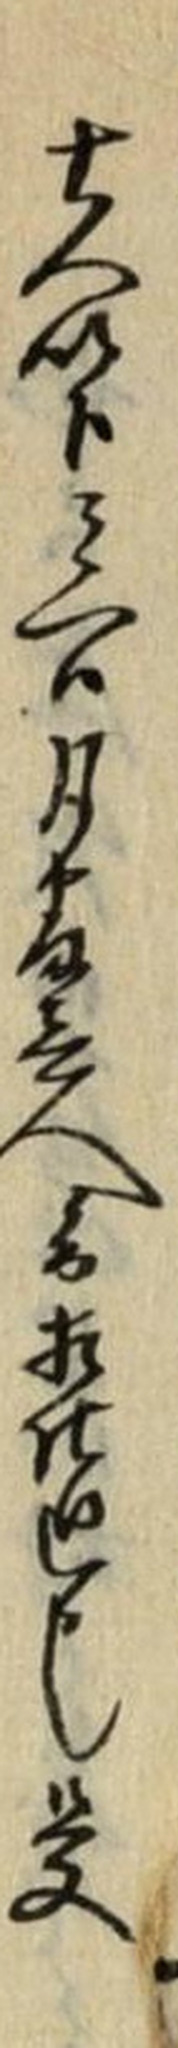十人以下に候へは月番壱人に而相仕廻申候且又
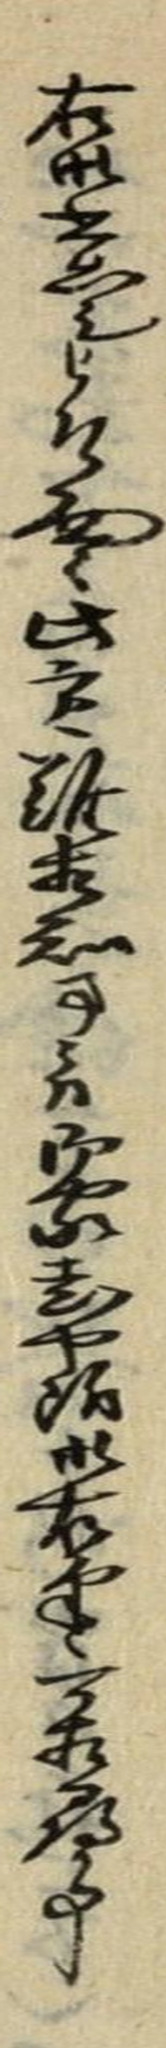右御書出し被下候面々此方へ難相知事に付御家老中附御右筆方へ可相尋事
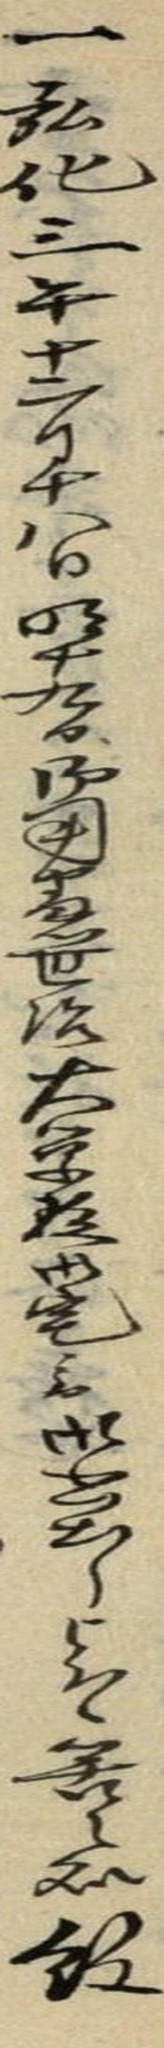一弘化三午十二月十八明十九日御用番笹治大学殿御宅に而御書出し被下候筈之処飯
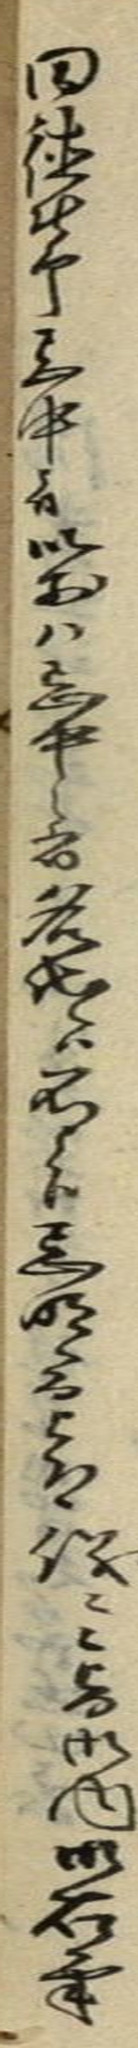田徳次郎忌中に付以前は忌中之者は名代へは不被下忌明に而被下候儀に候旨御内御右筆
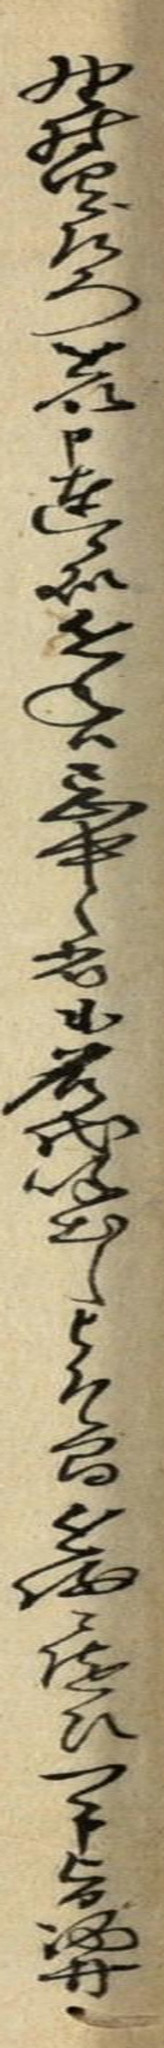野村四郎左衛門を以申達候処近年は忌中之者も名代呼出し被下候間近例に随ひ可申旨酒井
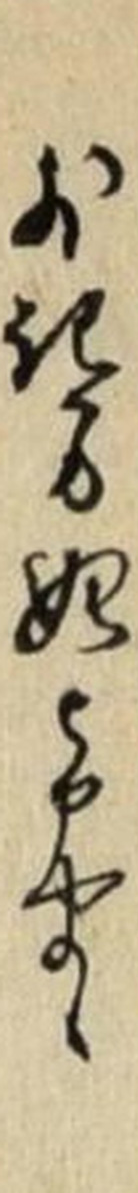外記方始被申聞候
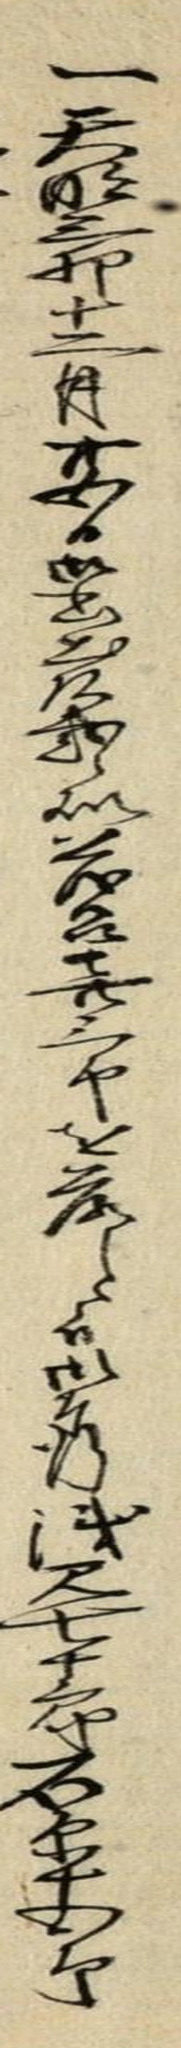一天明三卯十二月廿五日御書出頂戴候処茂呂喜三郎を落し候に付御奉行浅見七十郎石原十五郎
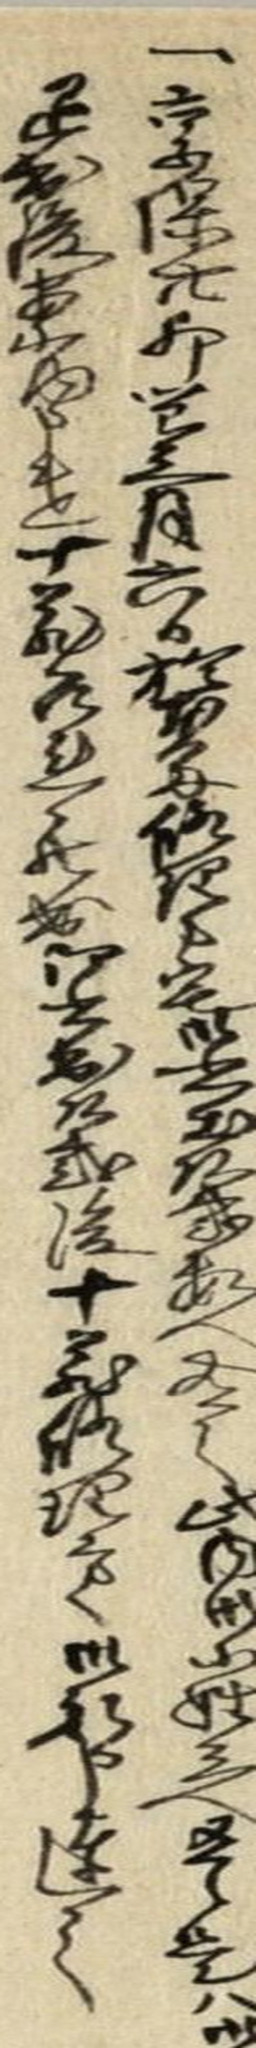退出後案内申遣十蔵召連罷出御書出頂戴後十蔵修理方へ御礼申達之

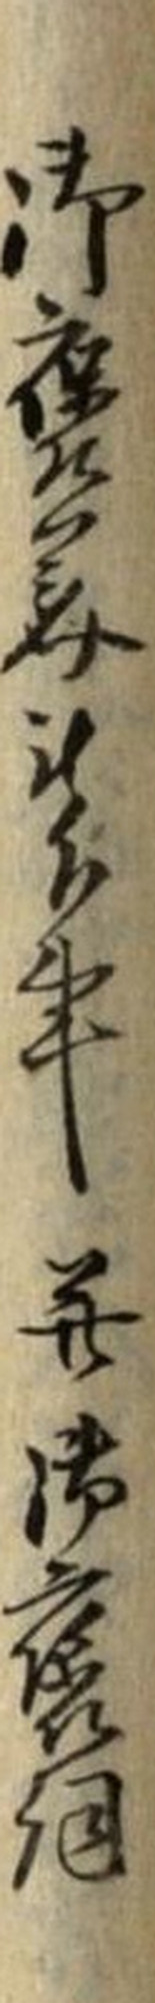御褒美被下事并御褒詞
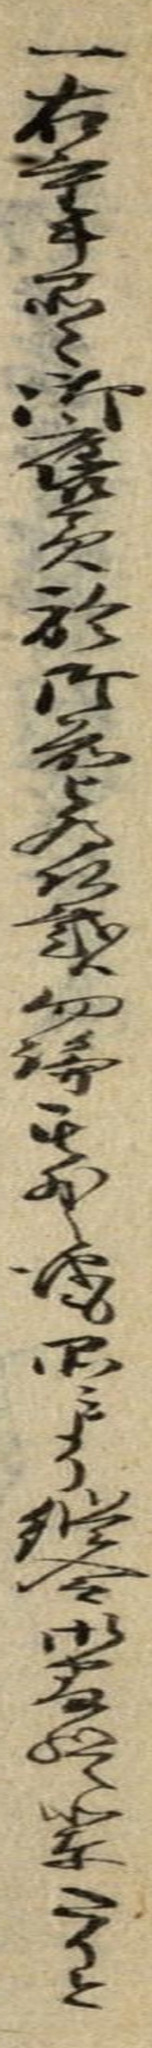一右重キ品々御褒美於御前被為頂戴は勿論其外之儀も品により縦令御番組之輩たりと
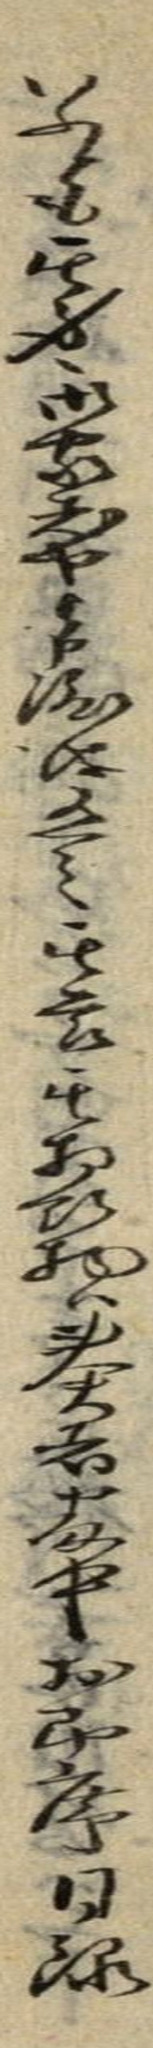いふとも其身へ御家老中被申渡候儀有之其節拝領物は奏者番中於即席目録
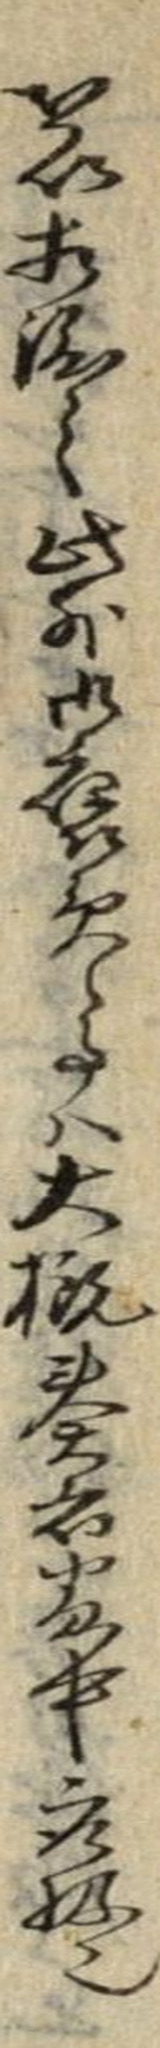を以相渡之此外御褒美之事は大概奏者番中取扱也
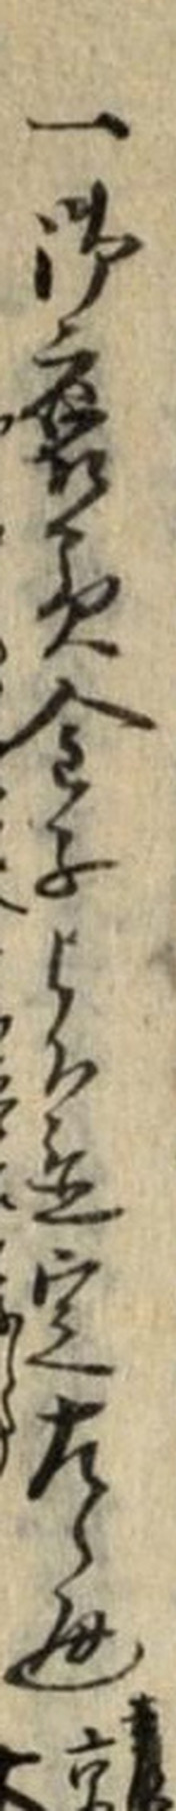一御褒美金子被下置定左之通
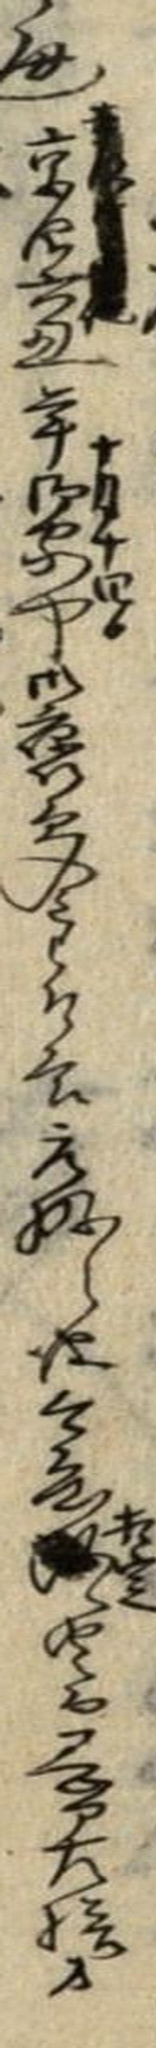享保六丑年十月十四日御家中御褒美金被下候節取扱之儀今度相定候由に而岡部左膳方
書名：御用并被仰出之部
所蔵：福井県文書館 Fukui Prefectural Archives
